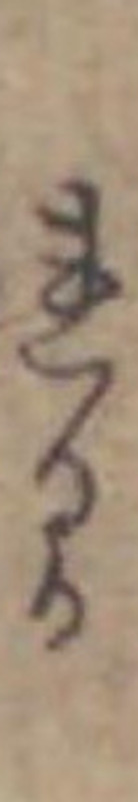れるか
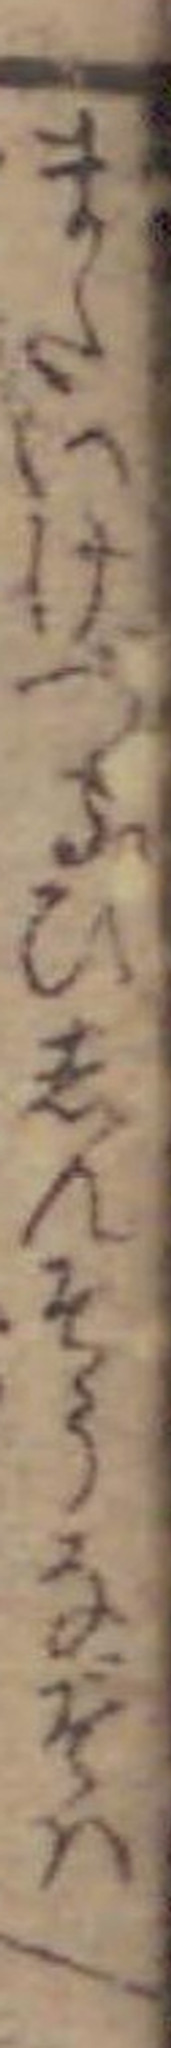またいけづなひしんそうなぞは
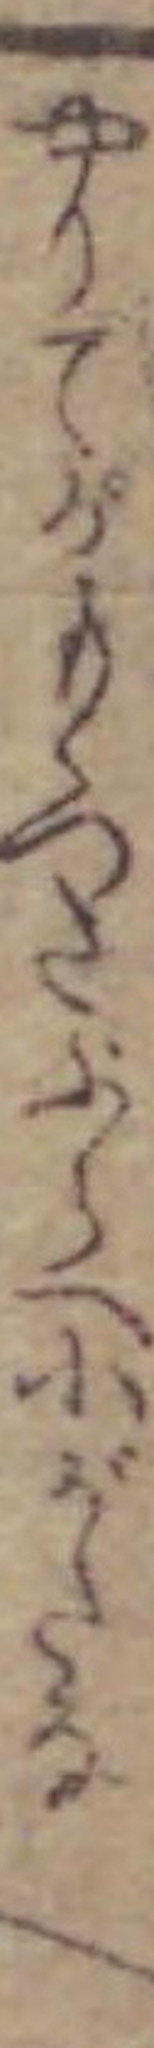やりてがもらつたぶらへ小がたな
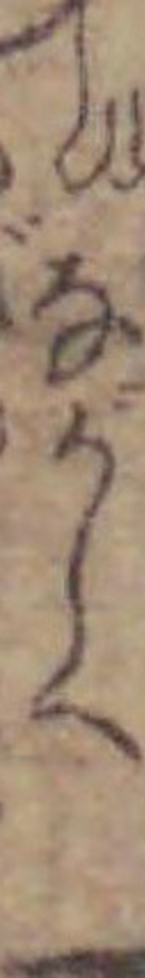ながしへ
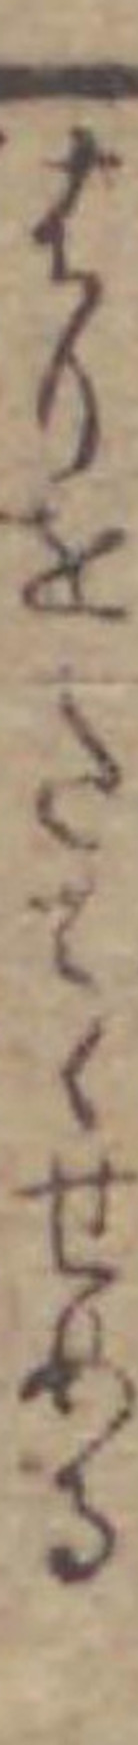はりをたてゝせめる
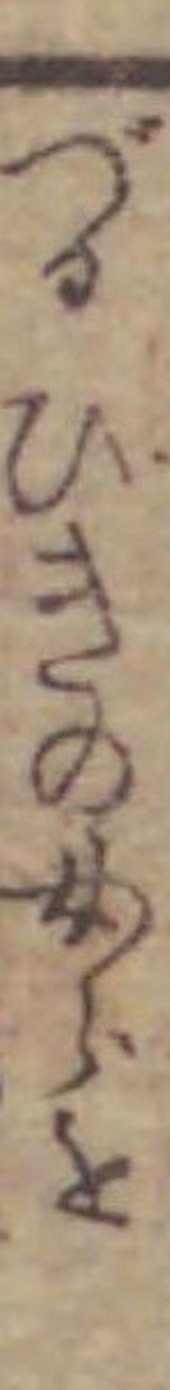づるひきの女郎を
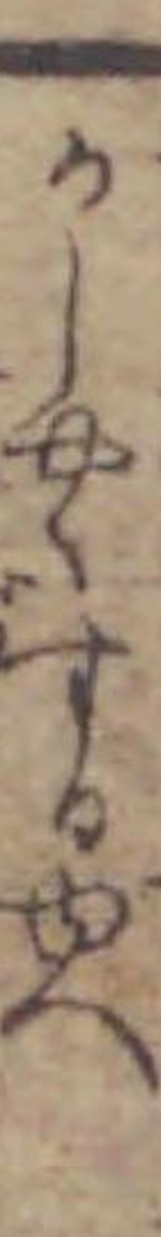かしやくするゆへ
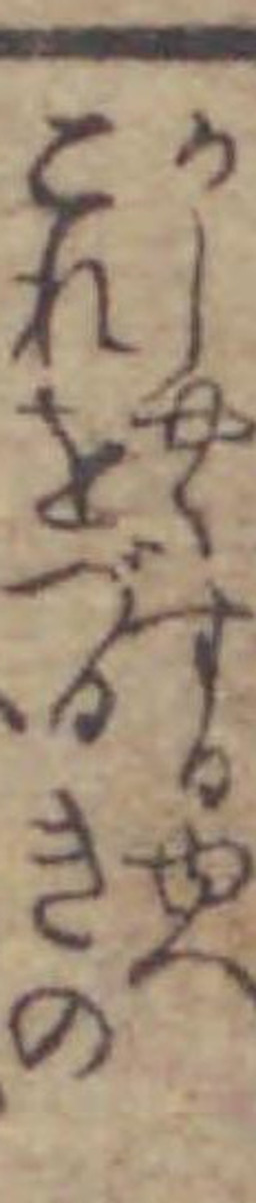これをづるきの
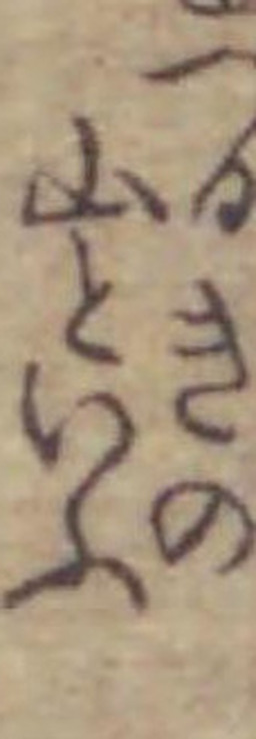山といふ
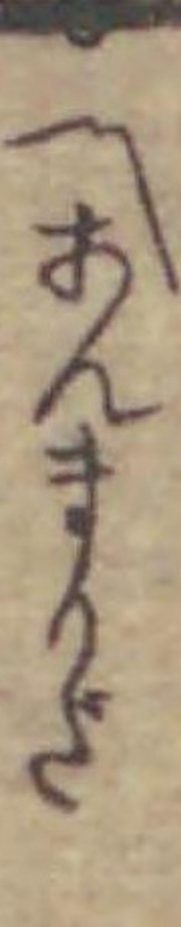「あんまりだ
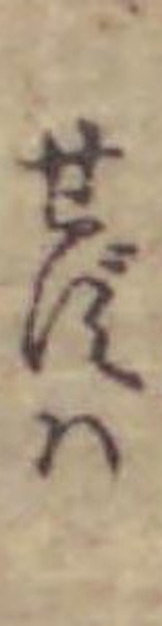せずは
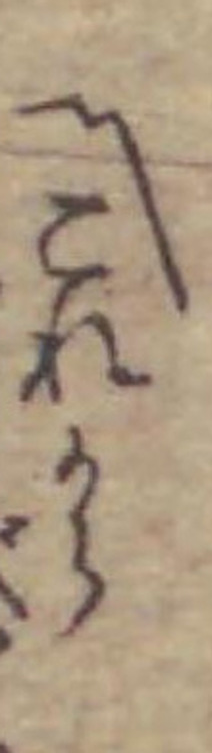「これから
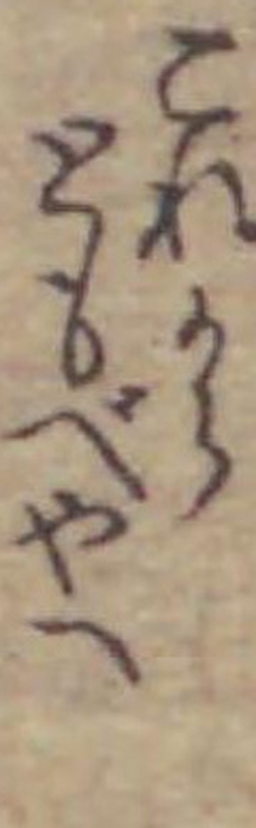ともべやへ
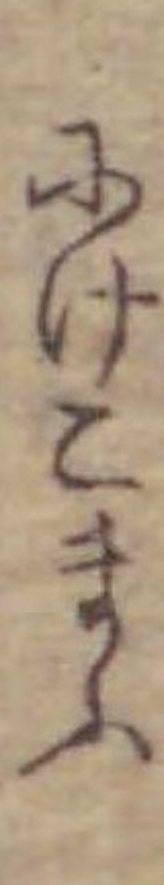にけこまふ

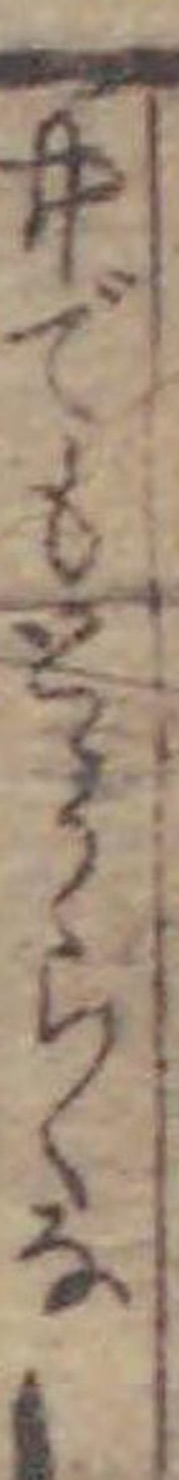中でもとうらくな
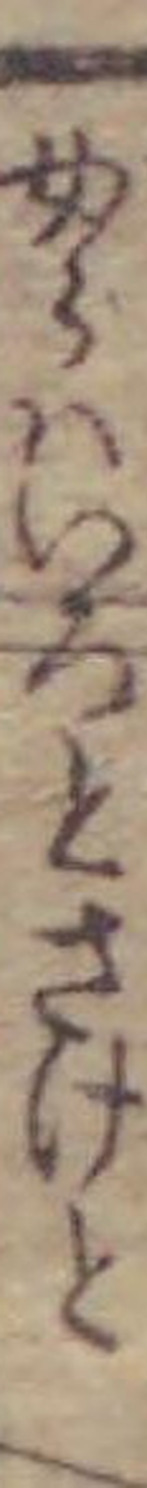女郎はいろとさけと
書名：九替十年色地獄 : 3巻
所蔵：国立国会図書館 National Diet Library, JAPAN
